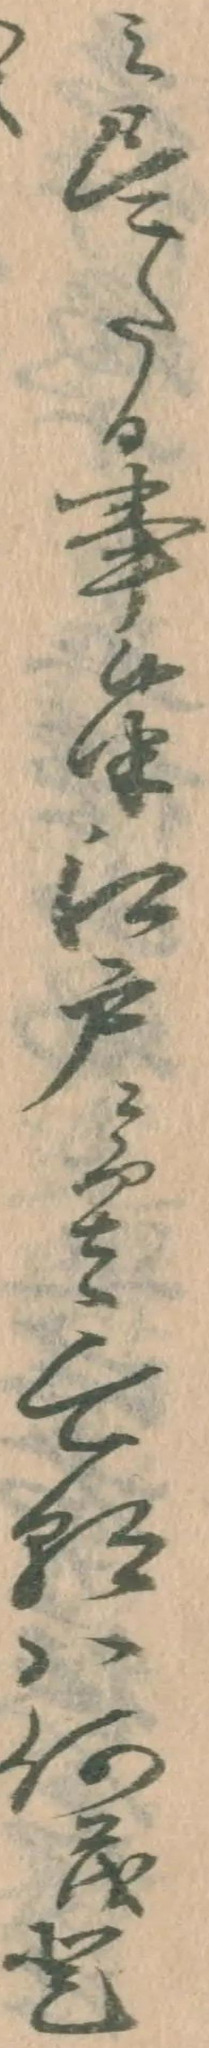之尽たる事候半江戸に而者今朝は何茂登
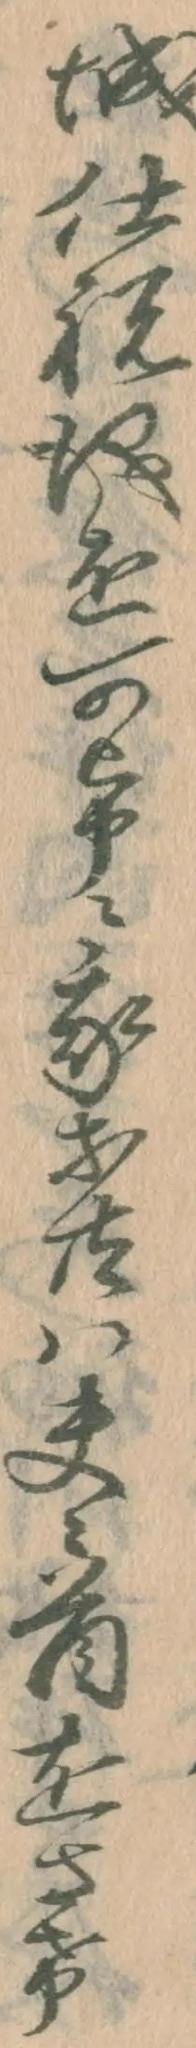城仕祝儀を可被申に我等共は夫々首をさ希
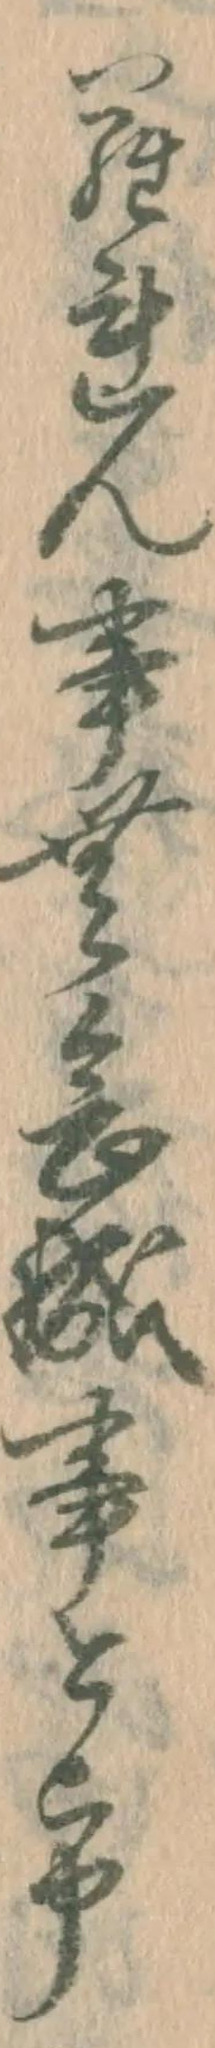羅連ん事無急成事と被申
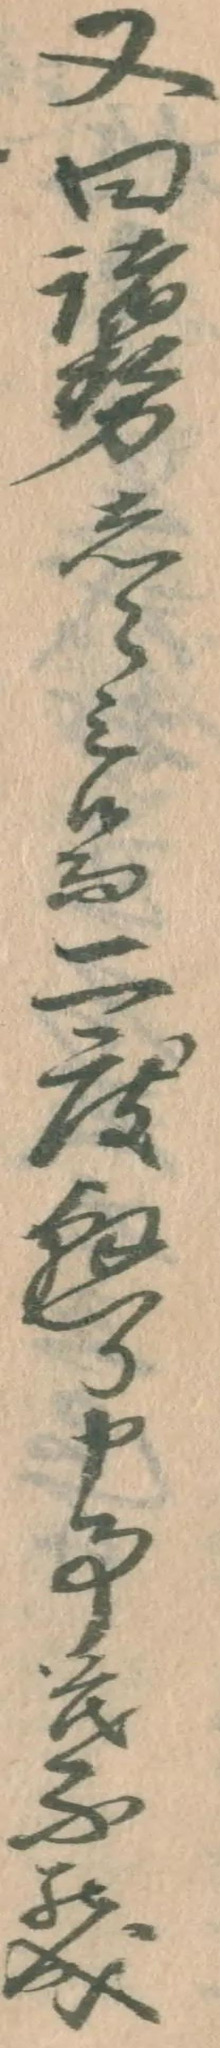又曰諸勢志らみ候而二度懸り申事茂ふ罷成
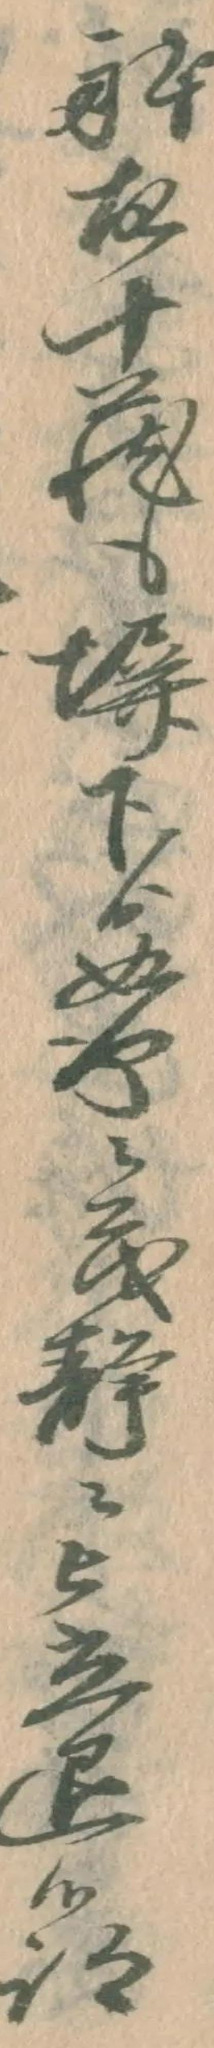躰故十蔵も塀下ゟ如何に茂静に被立退候跡
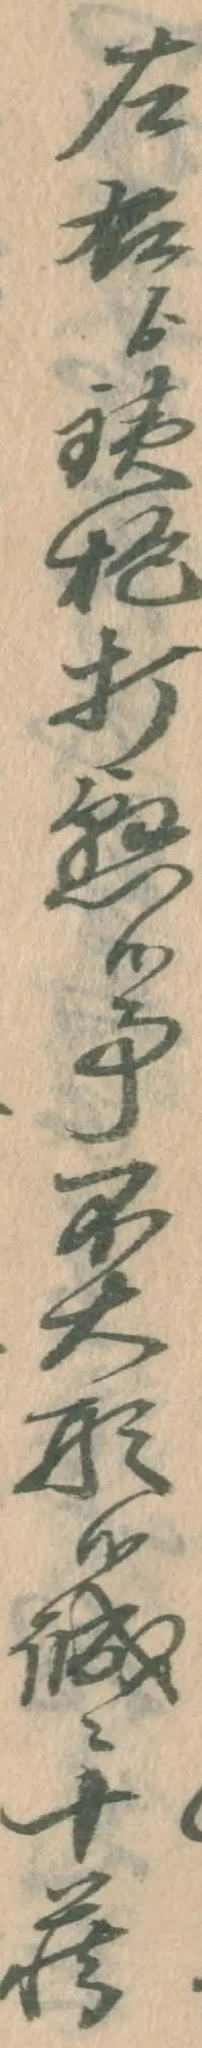左右ゟ鉄炮打懸候事不大形候誠に十蔵
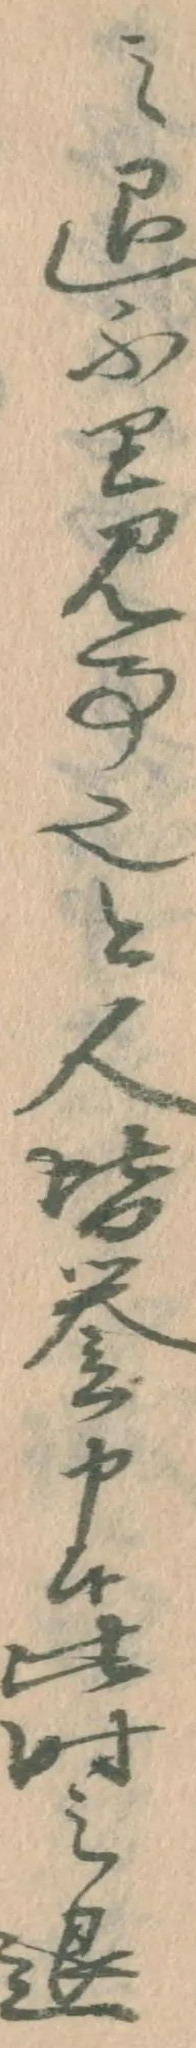之退ふり見事也と人皆誉申候此時之退
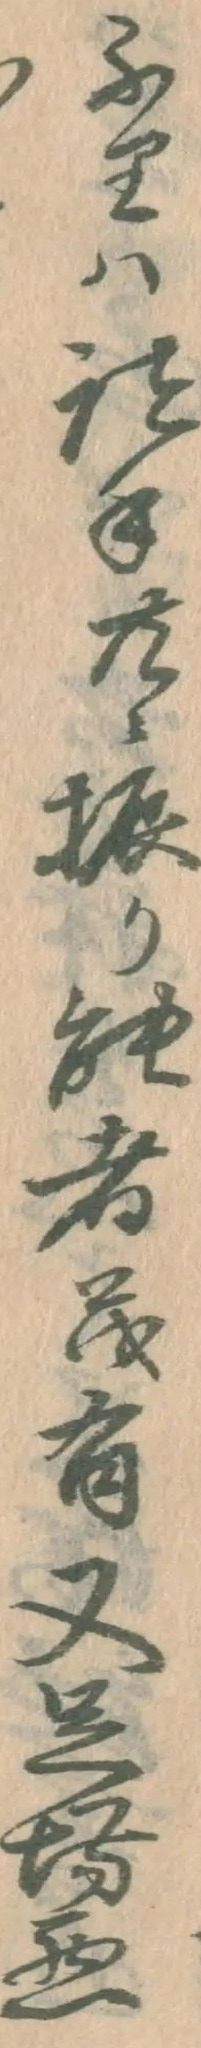ふ里は諸手共に振り能者茂有又足場悪
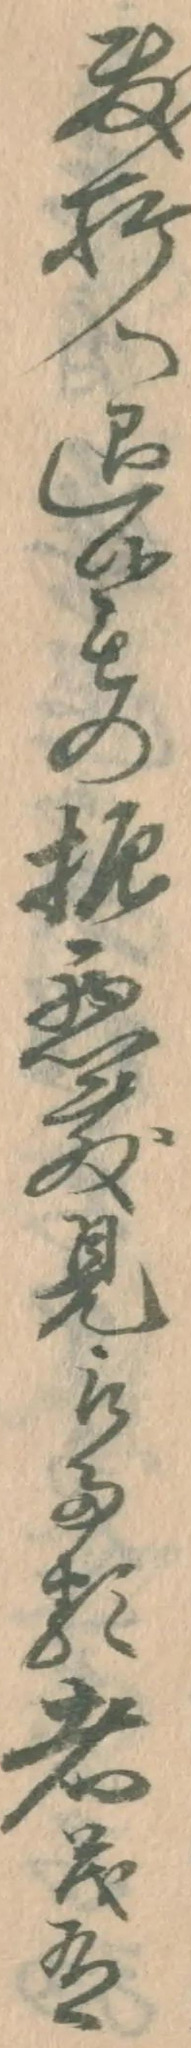敷所へ退候もの振悪敷見江多類者茂有

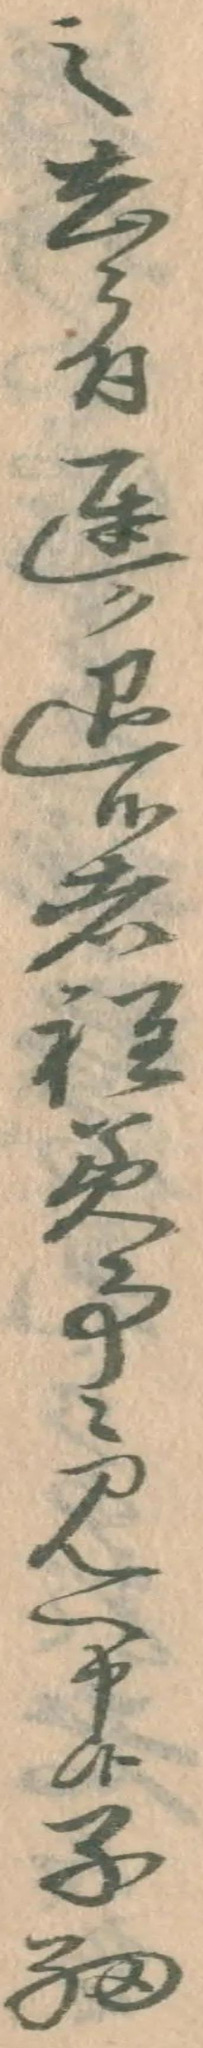之去に付遅く退候者程美事に見へ申候子細
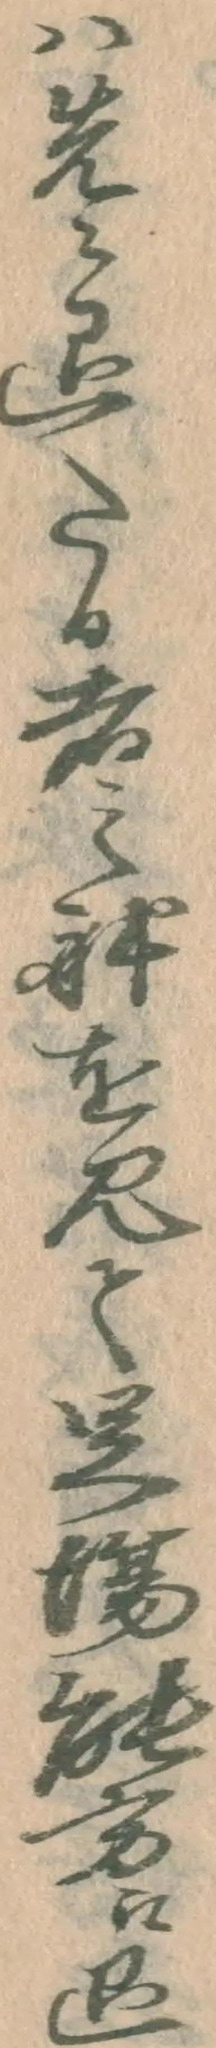は先に退たる者之躰を見て足場能方江退
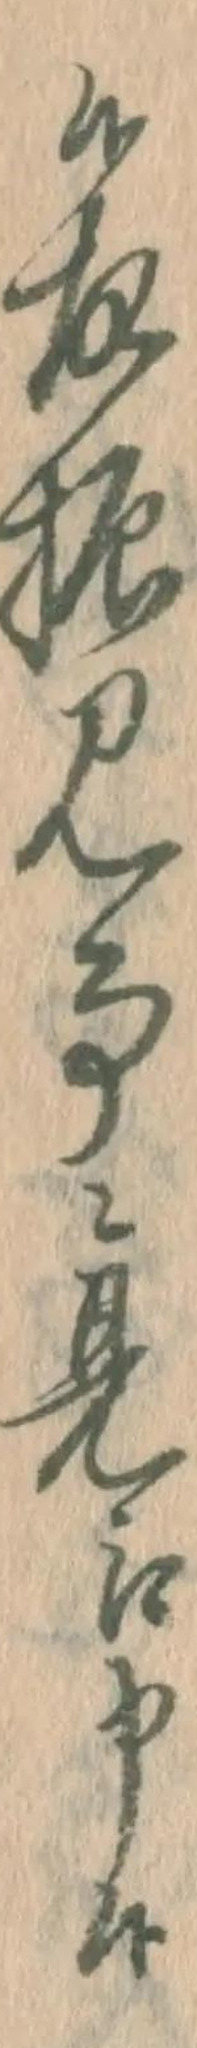候故振見事に見江申候
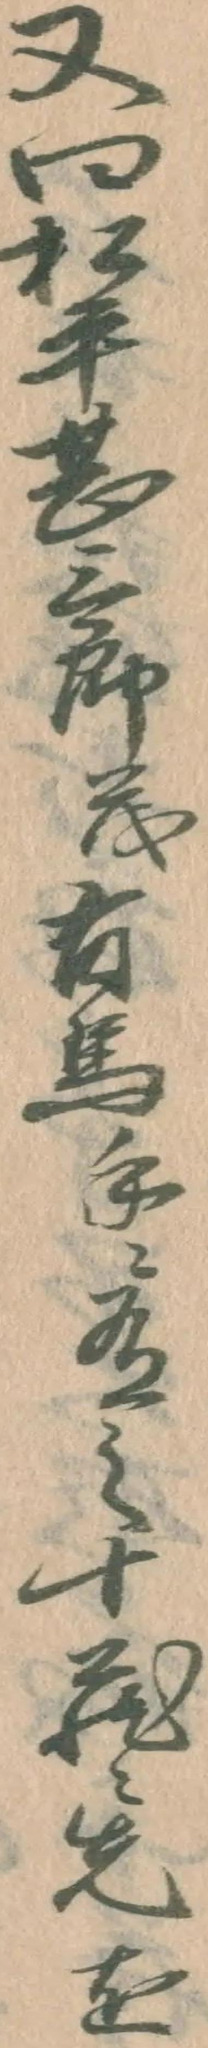又曰松平甚三郎茂有馬手に有之十蔵に先を
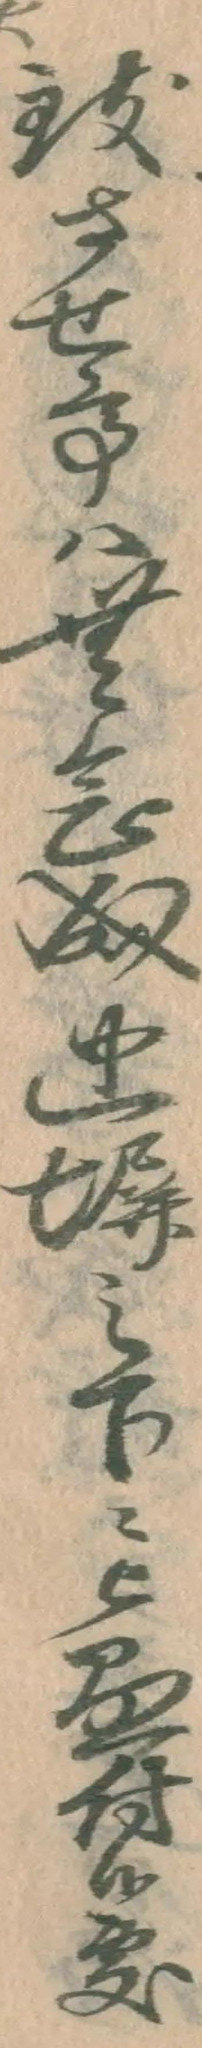致させ亭は無念成迚塀之下に被置付候處
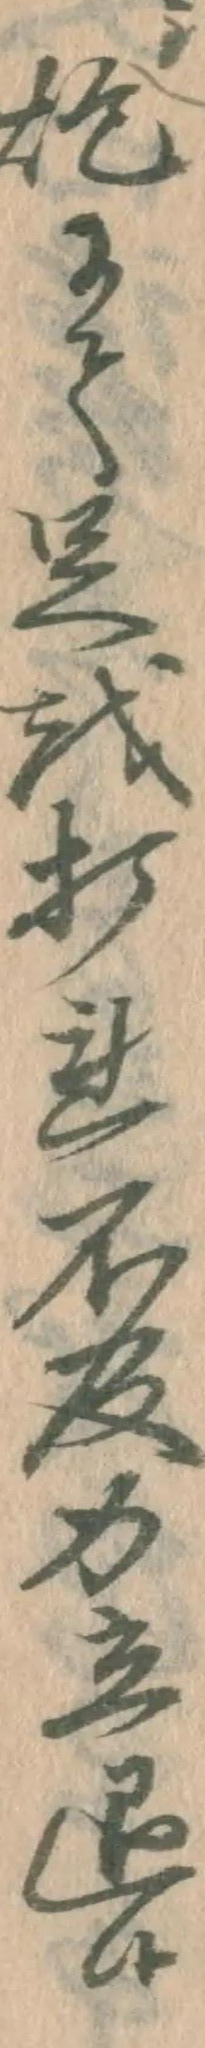鉄炮尓て足越打連不及為立退候
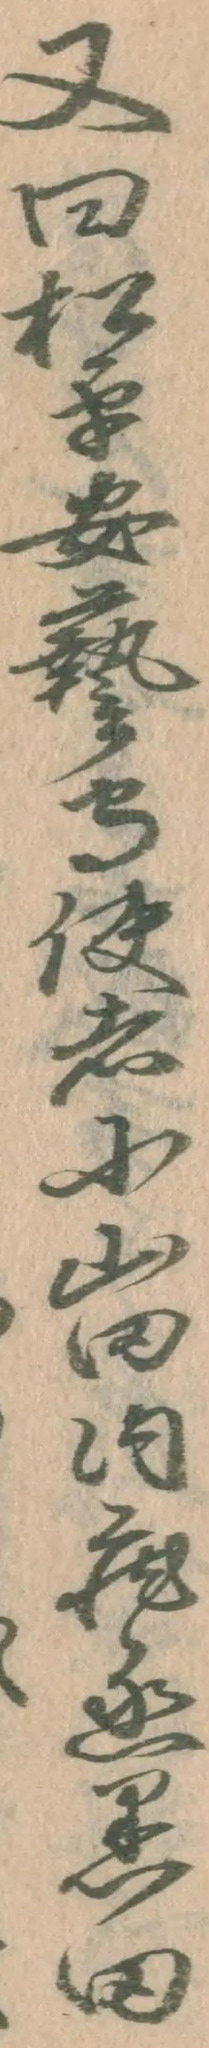又曰松平安芸守使者小山田内蔵丞黒田
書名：切支丹御退治記 49巻. [5]
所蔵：国立国会図書館 National Diet Library, JAPAN
